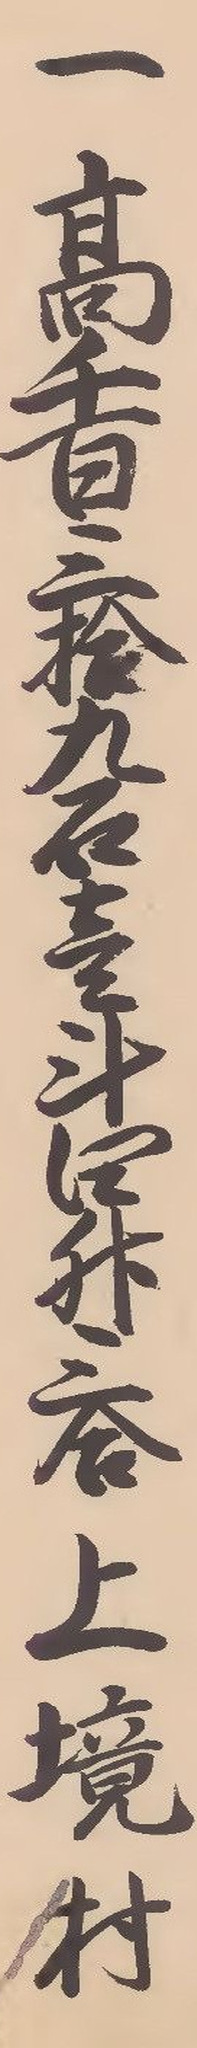一高千百三拾九石壱斗四升三合上境村

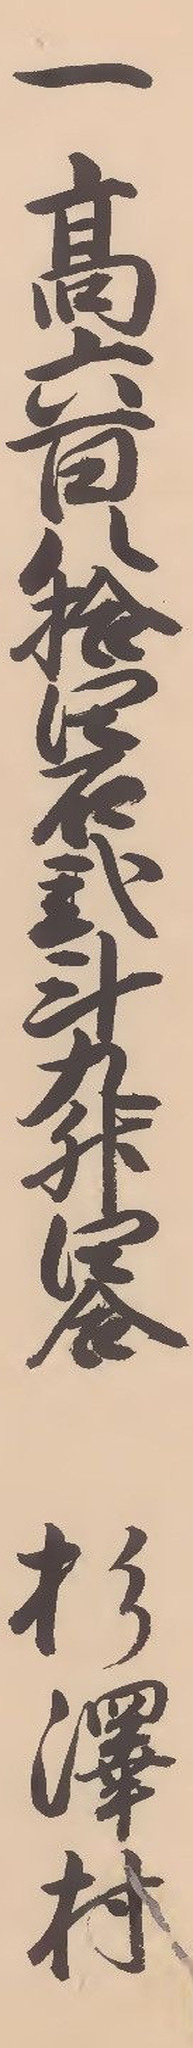一高六百八拾四石弐斗九升四合杉沢村
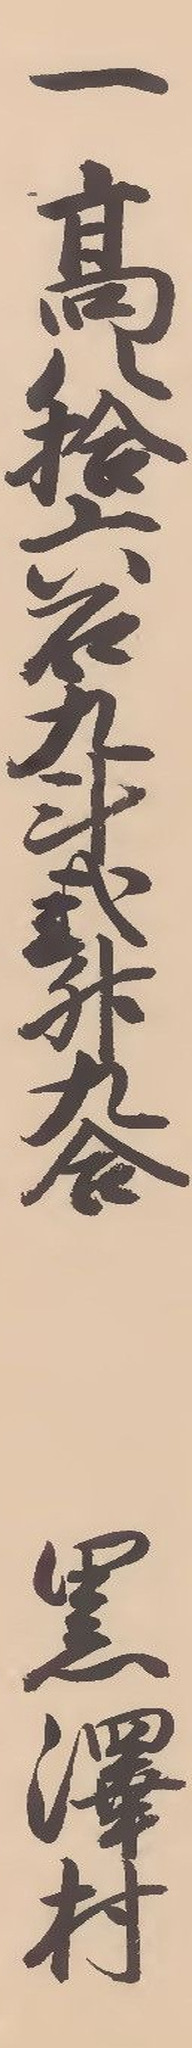一高八拾六石九斗弐升九合黒沢村
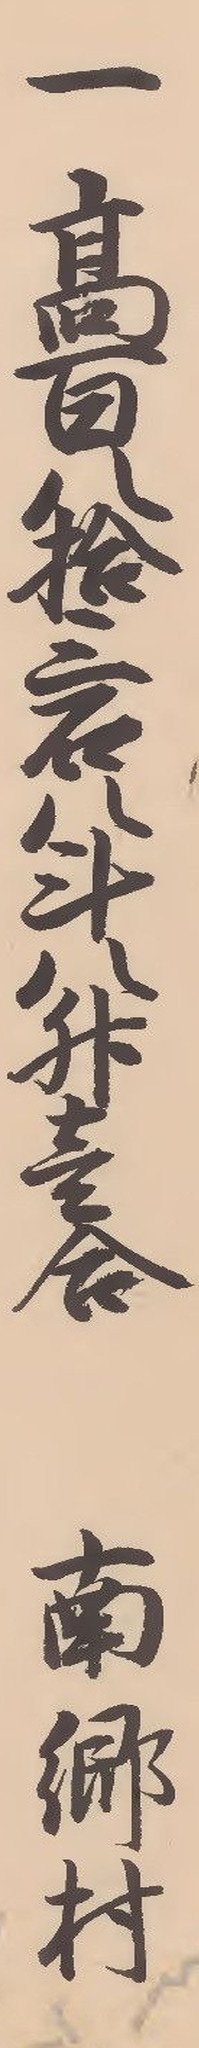一高百八拾三石八斗八升壱合南郷村
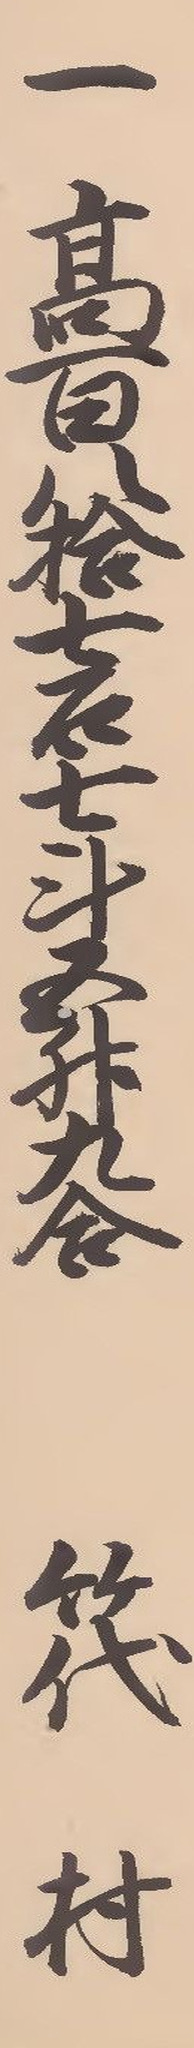一高百八拾七石七斗五升九合筏村
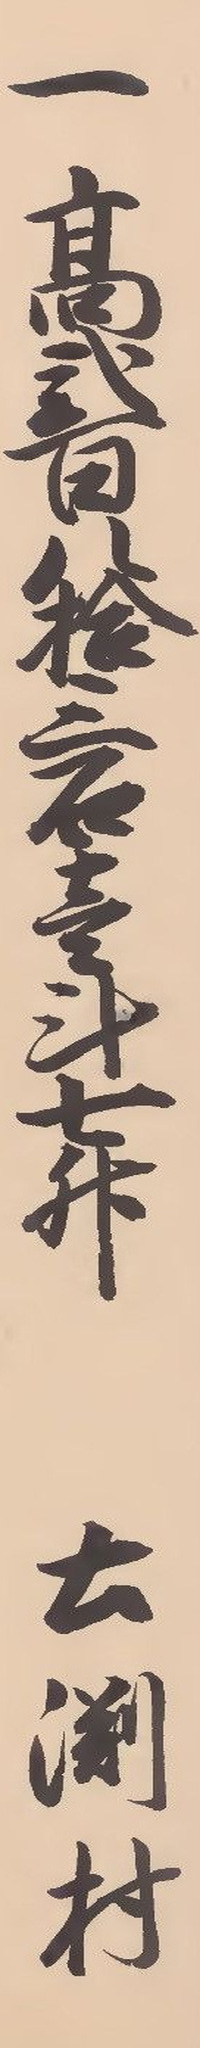一高弐百八拾三石壱斗七升土淵村
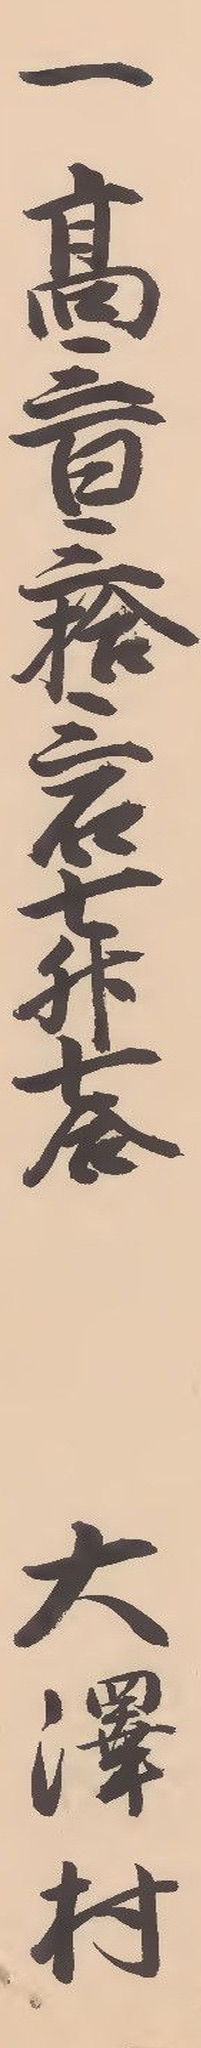一高三百三拾三石七升七合大沢村
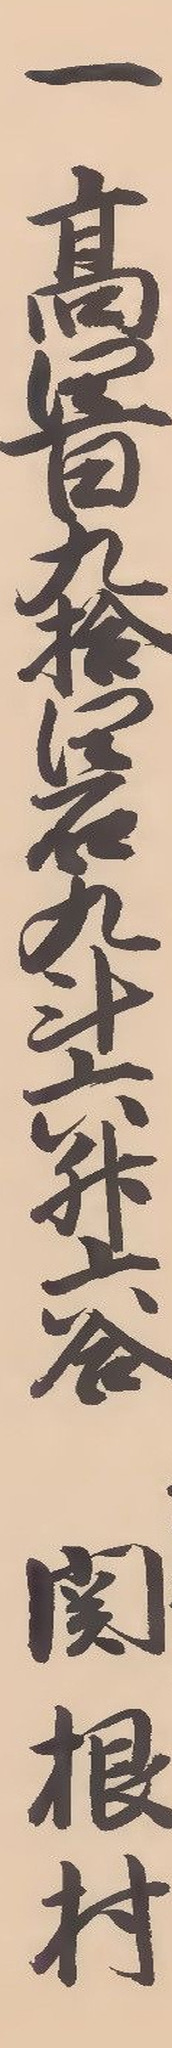一高四百九拾四石九斗六升六合関根村
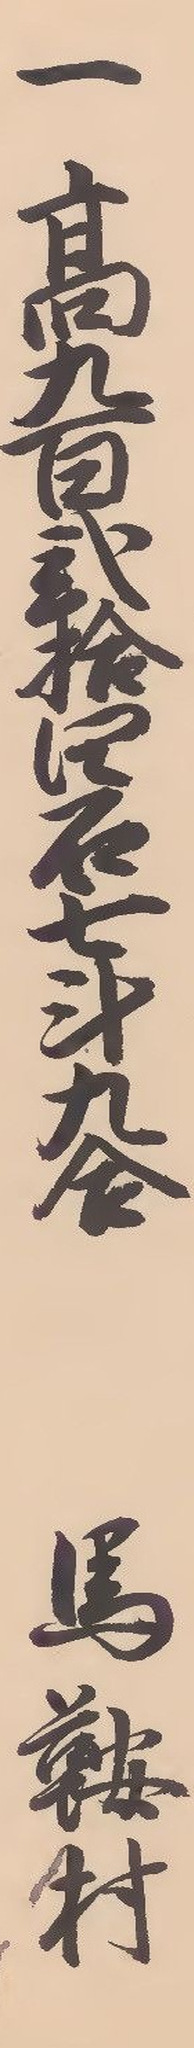一高九百弐拾四石七斗九合馬鞍村

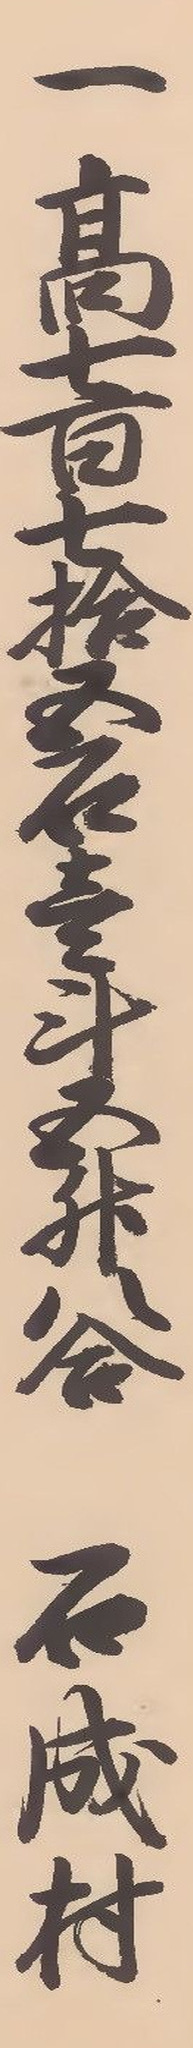一高七百拾五石壱斗五升八合石成村
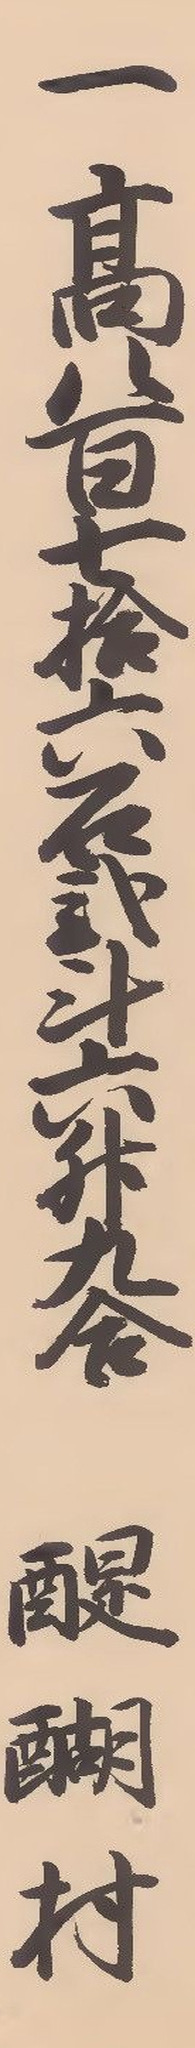一高八百七拾六石弐斗六升九合醍醐村
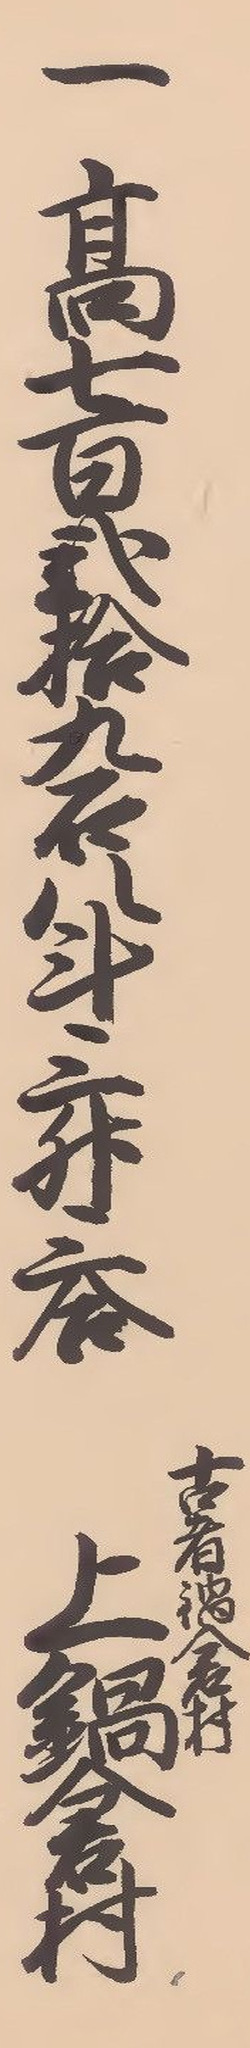一高七百弐拾九石八斗三升三合上鍋倉村
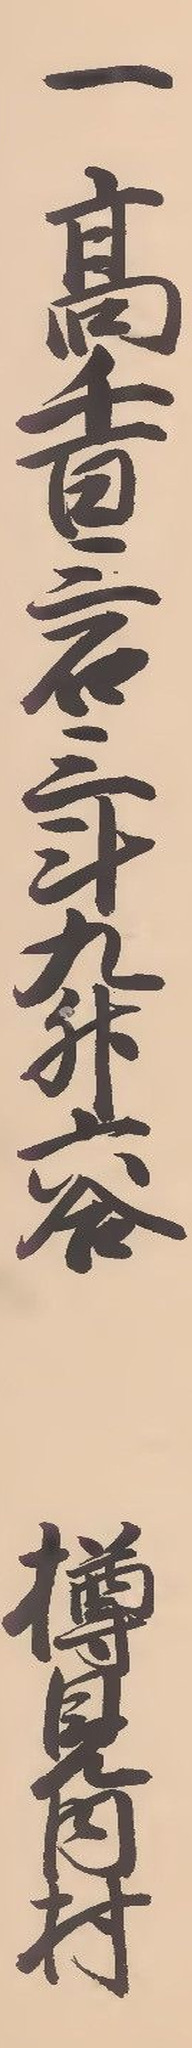一高千百三石三斗九升六合樽見内村
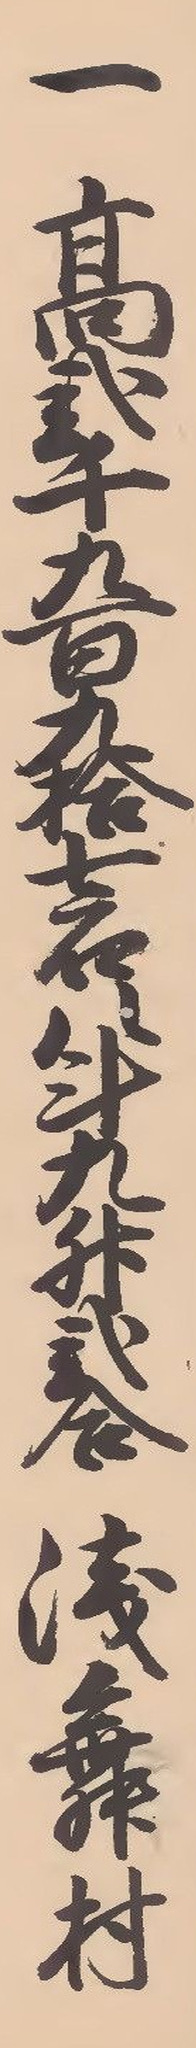一高弐千九百九拾七石八斗九升弐合浅舞村
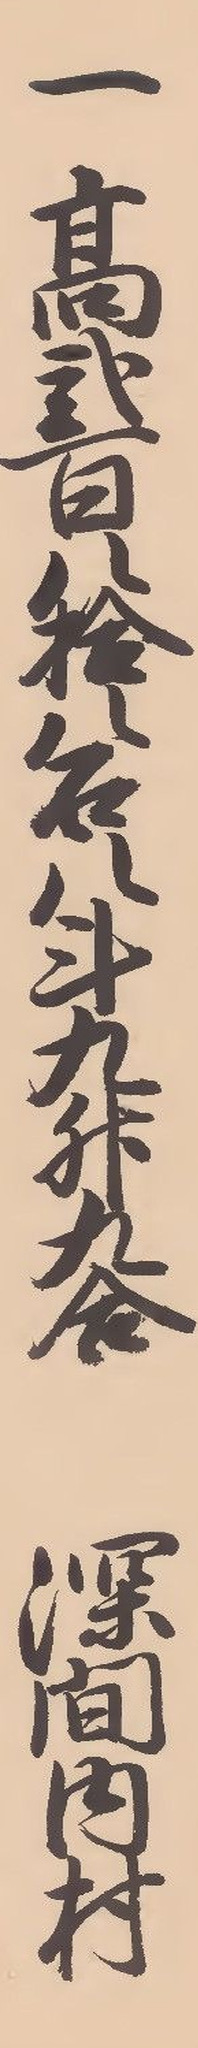一高弐百八拾八石八斗九升九合深間内村
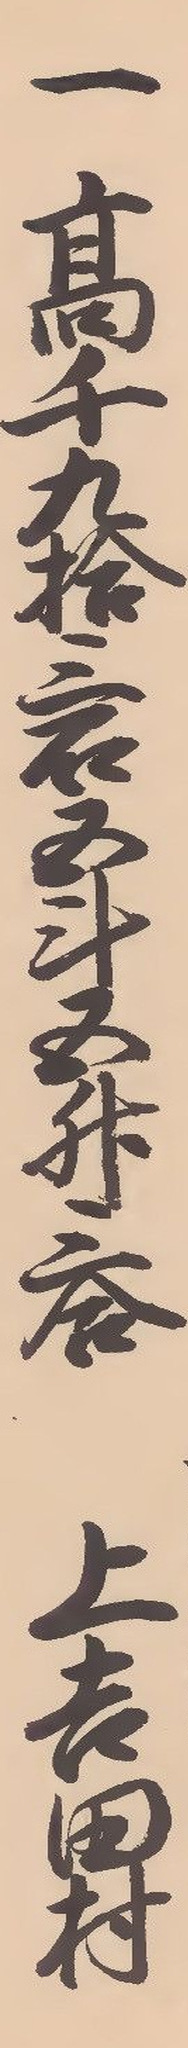一高千九拾三石五斗五升三合上吉田村
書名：出羽国郷帳　５
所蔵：国立公文書館 National Archives of Japan
